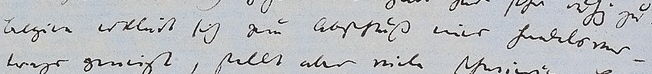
Belgien erklärt sich zum Abschluß eines Handelsver-
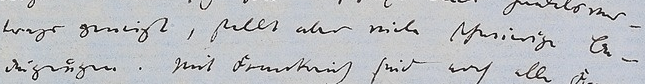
trags geneigt, stellt aber viele schwierige Be-
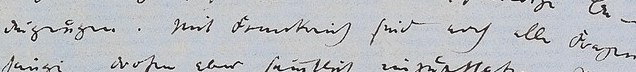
dingungen. Mit Frankreich sind noch alle Fragen
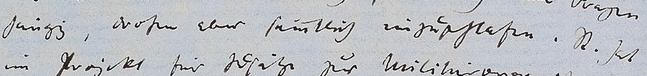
hängig, drohen aber sämmtlich einzuschlafen. St. hat
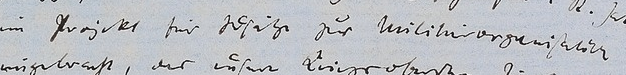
ein Projekt für Zusätze zur Militärorganisation
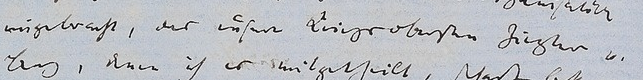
eingebracht, das unsere Kriegsobersten Ziegler &.
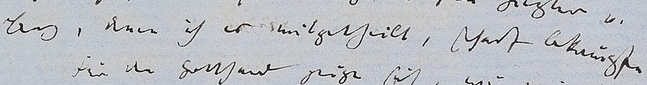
Benz, denen ich es mitgetheilt, scharf bekämpfen.
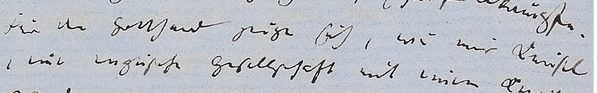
Für den Gotthard zeige sich, wie mir Knüsel
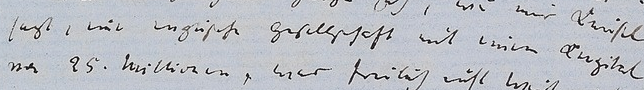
sagt, eine englische Gesellschaft mit einem Kapital
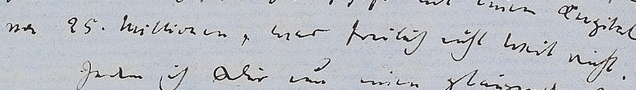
von 25. Millionen, was freilich nicht weit reicht.
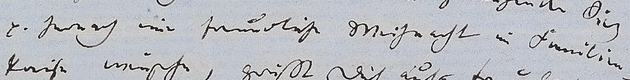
&. hernach eine freundliche Weihnacht im Familien-
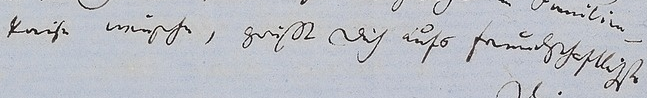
kreise wünsche, grüßt Dich aufs freundschaftlichste
